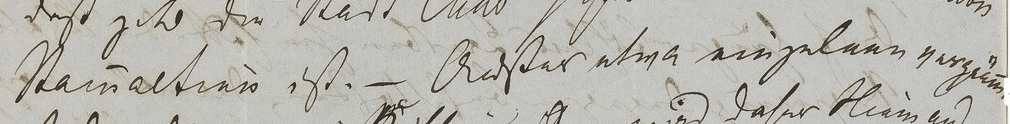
Stammactien ist. – Außer etwa einzelnen vergrämten
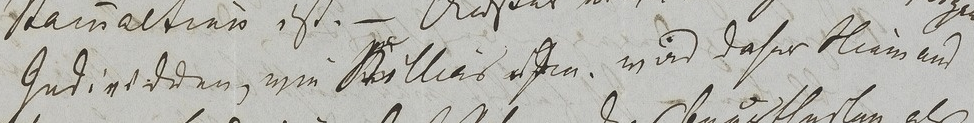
Individuen, wie Killias usw. wird daher Niemand
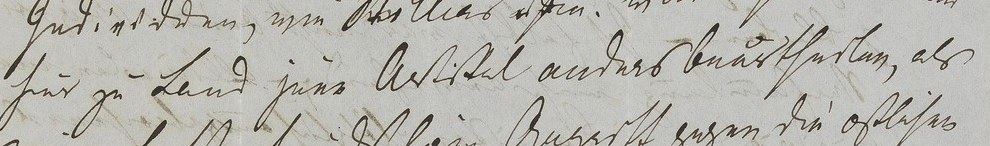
hier zu Land jene Artikel anders beurtheilen, als
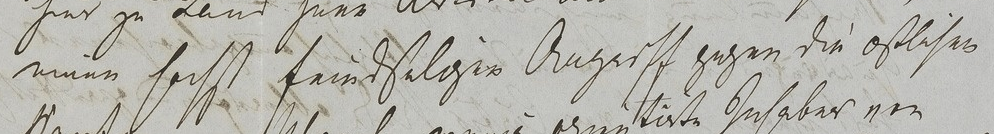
einen höchst feindseligen Angriff gegen die östlichen
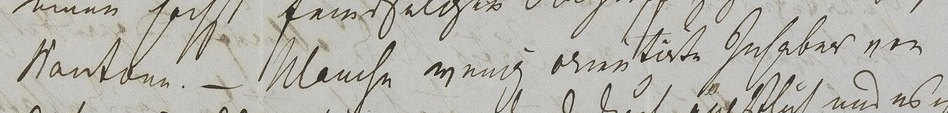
Kantone. – Manche wenig orientirte Inhaber von
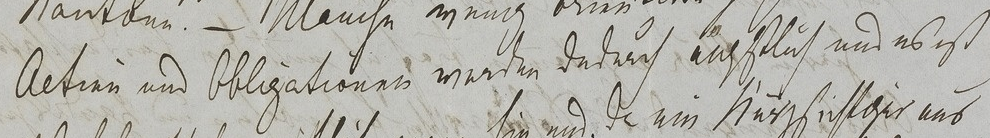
Actien und Obligationen werden dadurch ängstlich und es ist
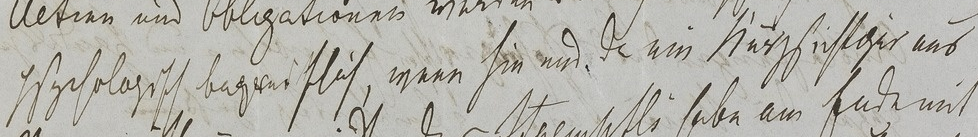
psychologisch begreiflich, wenn hie und da ein Kurzsichtiger aus
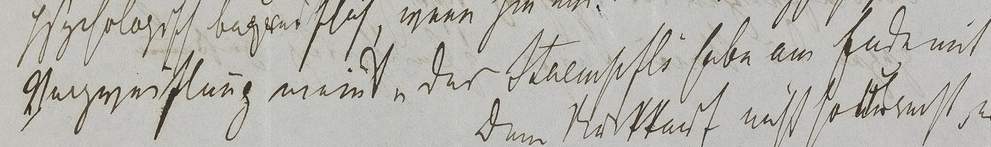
Verzweiflung meint «der Staempfli habe am Ende mit
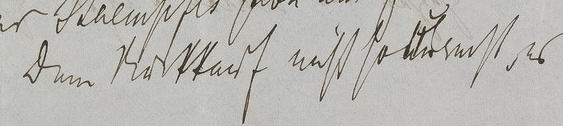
dem Rückkauf nicht so Unrecht, es
